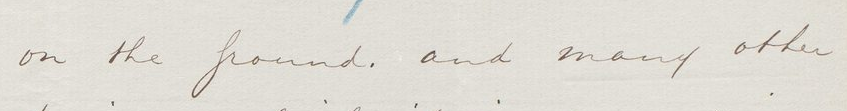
on the ground, and many other
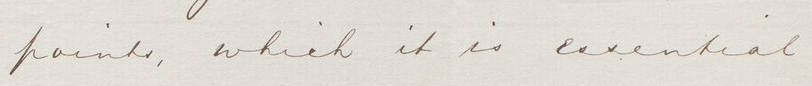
points, which it is essential
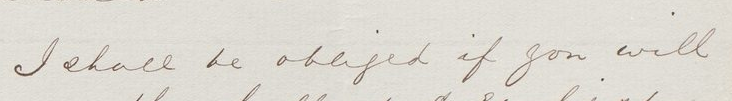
I shall be obliged if you will
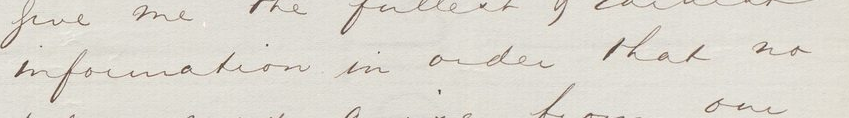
information in order that no
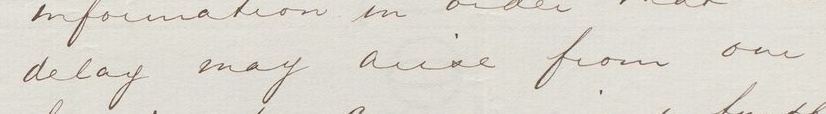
delay may arise from our
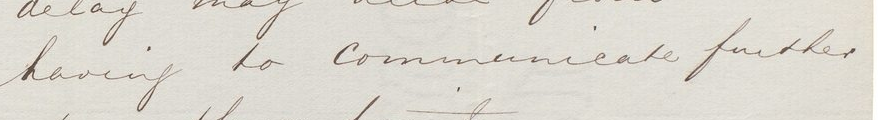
having to communicate further
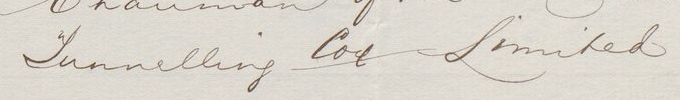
Tunnelling Coy Limited
